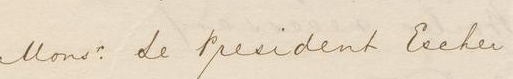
Monsr Le President Escher
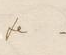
etc. –
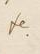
etc. –
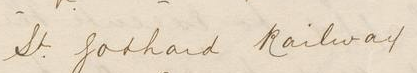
St. Gothard Railway
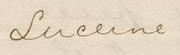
Lucerne
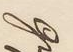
Sir,
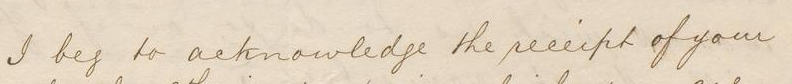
I beg to acknowledge the receipt of your
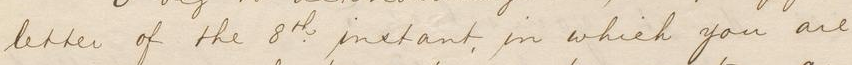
letter of the 8th instant, in which you are
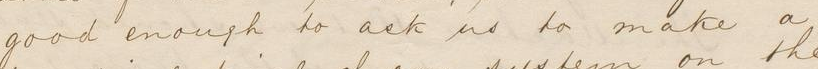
good enough to ask us to make a
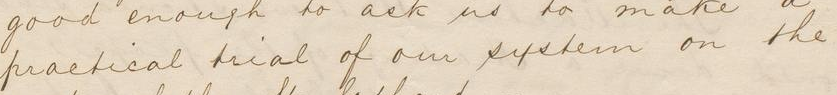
practical trial of our system on the
